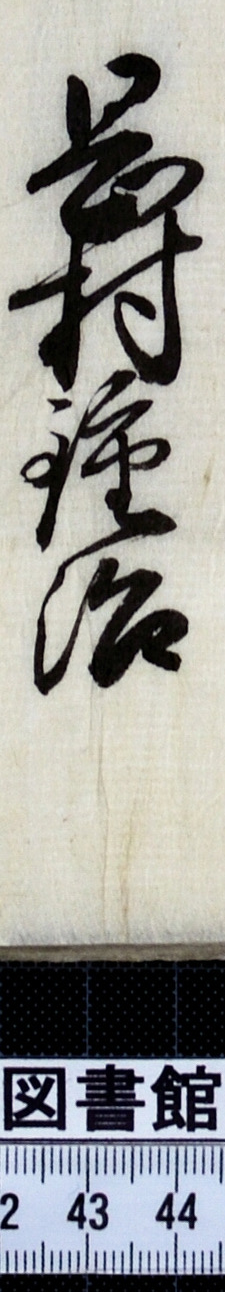岡村鍾治
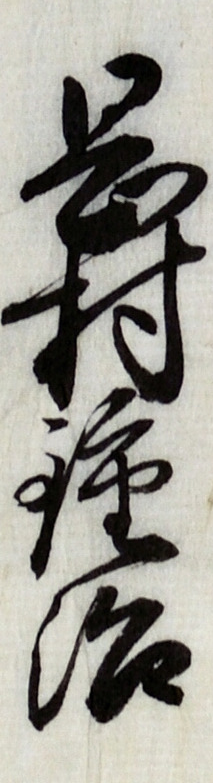岡村鍾治
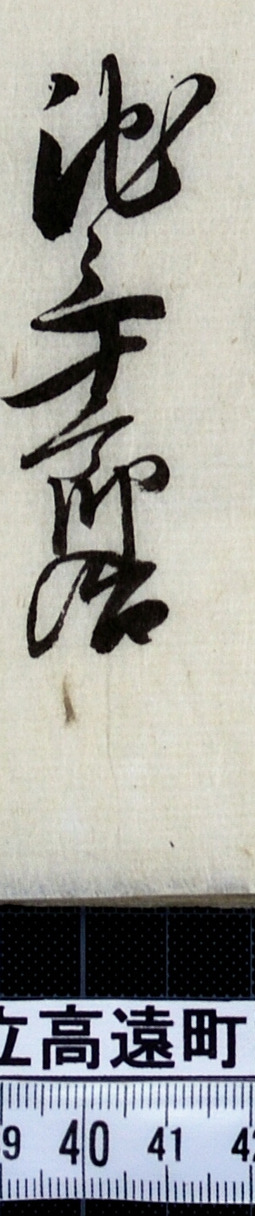池上十郎治
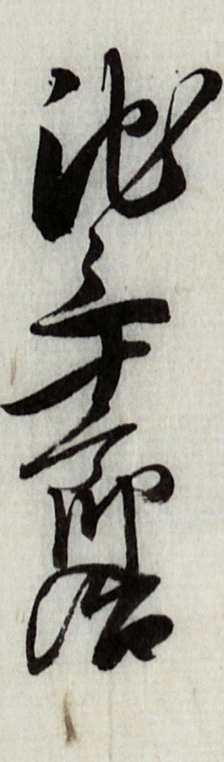池上十郎治
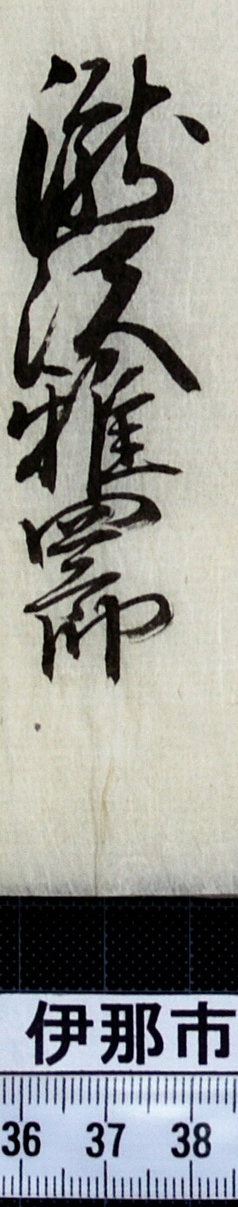滝沢雅四郎

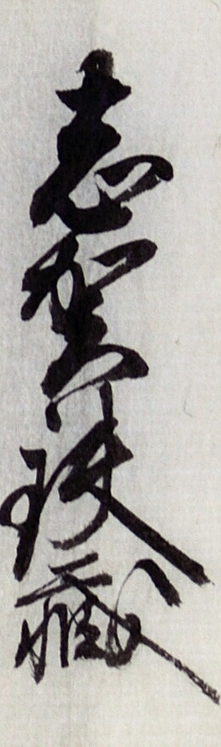志賀鉄蔵
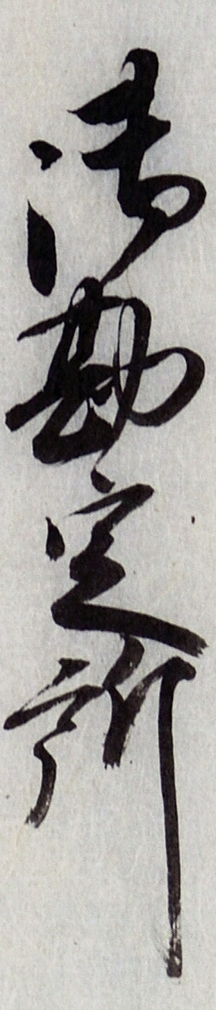御勘定所
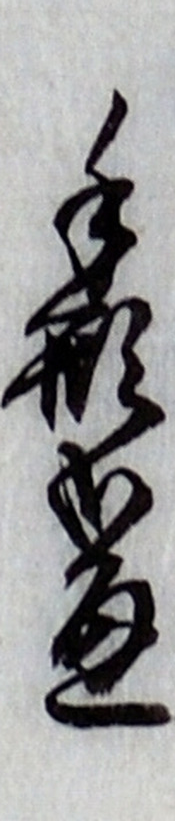手形弐通
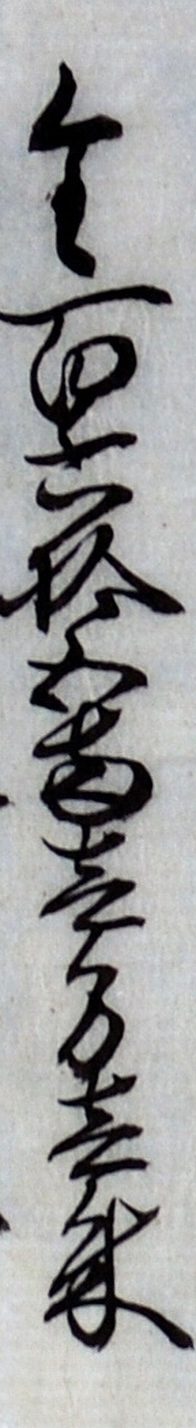金百六拾五両壱分壱朱
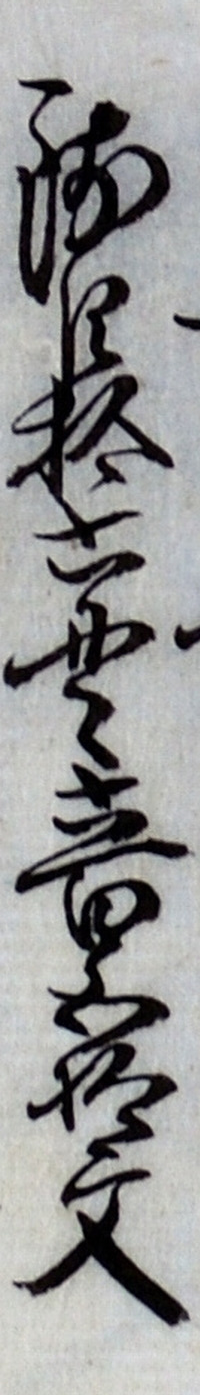銭四拾六貫六百五拾文
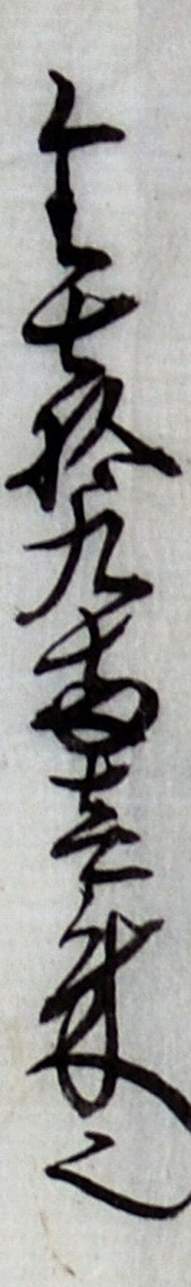金七拾九両壱朱也
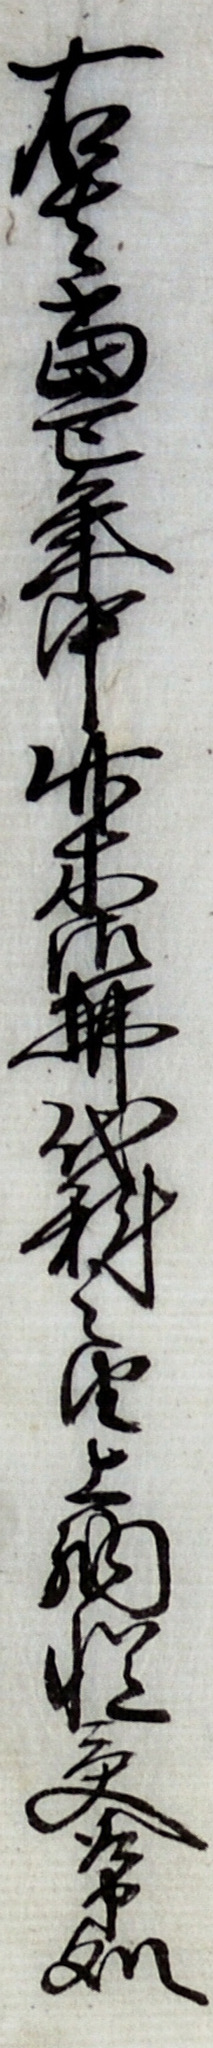右者当巳年中竹木御払代料之由上納慥受取申処

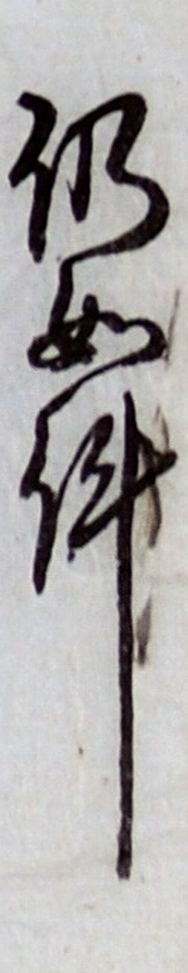仍如件
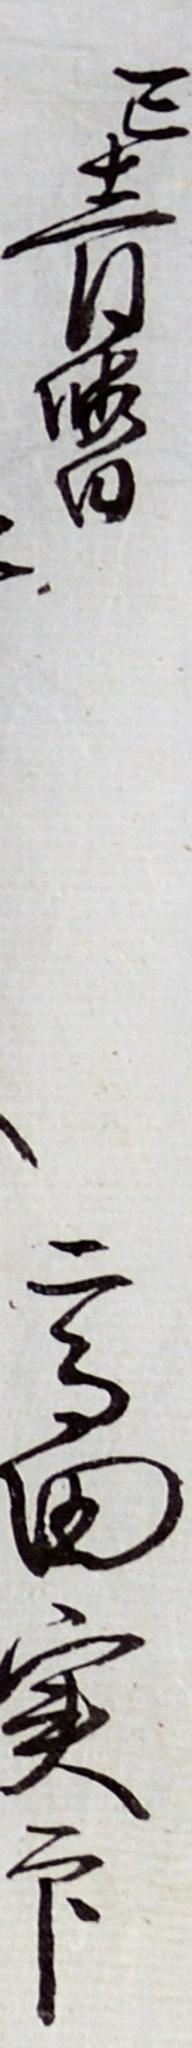巳十二月晦日高田実印
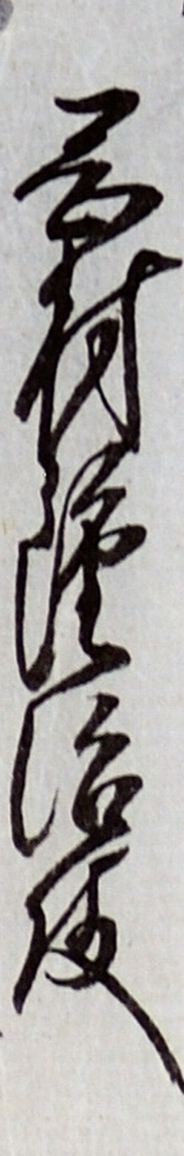岡村鍾治殿
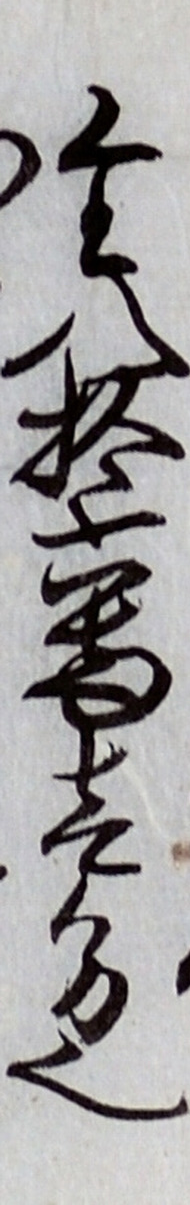金八拾六両壱分也
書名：御山方御林方御藪方巳年中請払御勘定帳
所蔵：伊那市立高遠町図書館・合同会社AMANE
